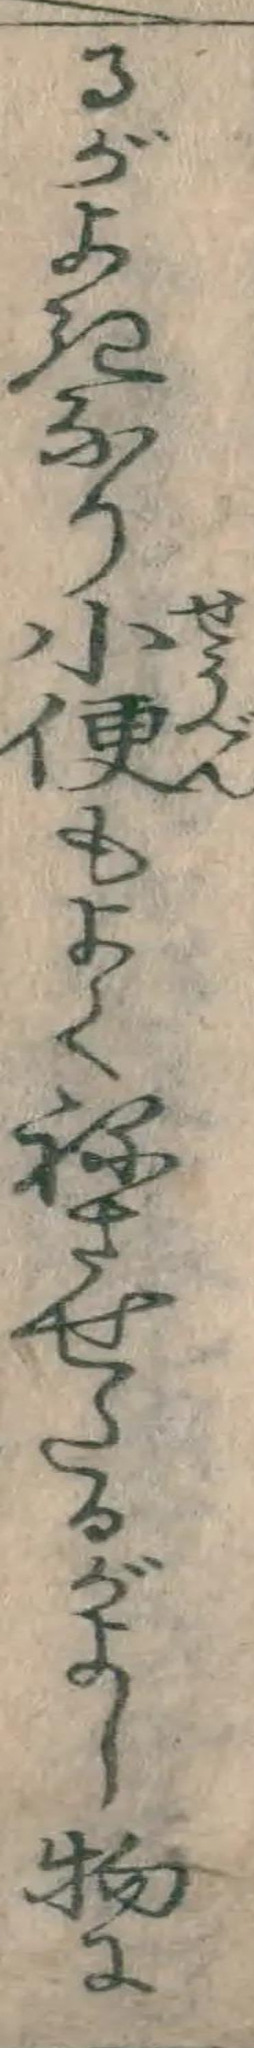るがよきなり小便もよくねさせたるがよし物に
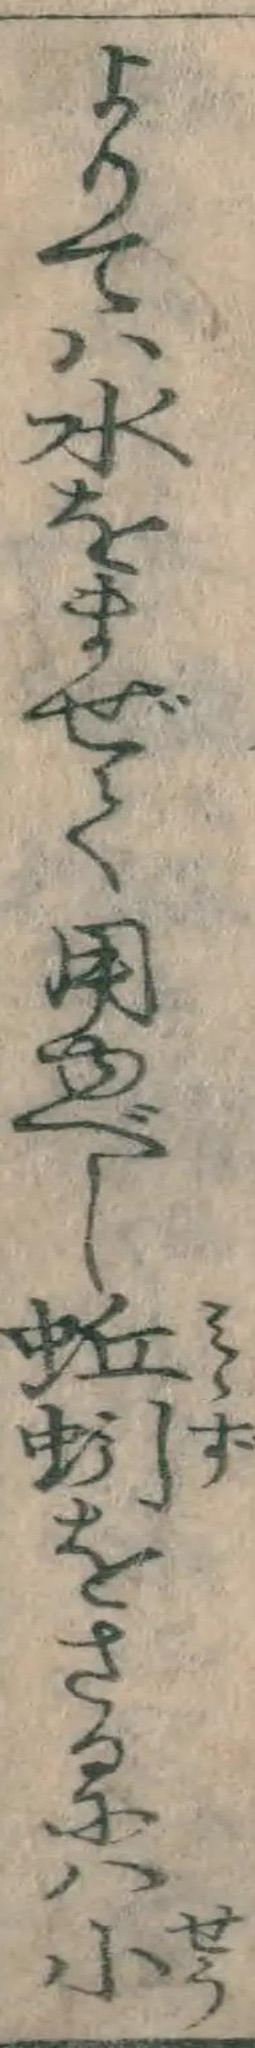よりては水をまぜて用ゆべし蚯蚓をさるには小

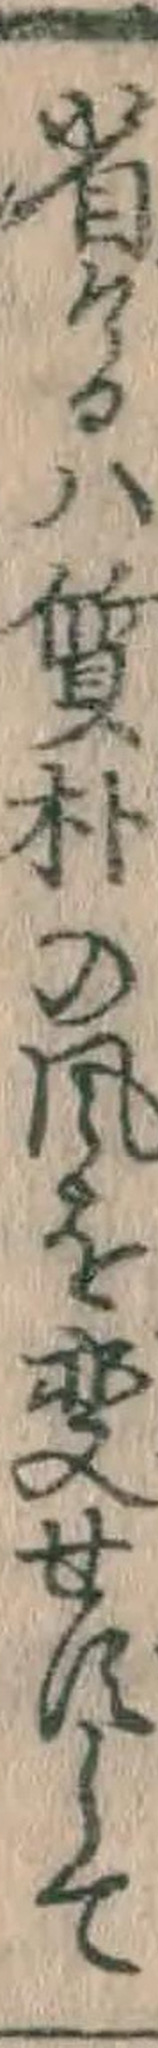省けるは質朴の風を変せずして
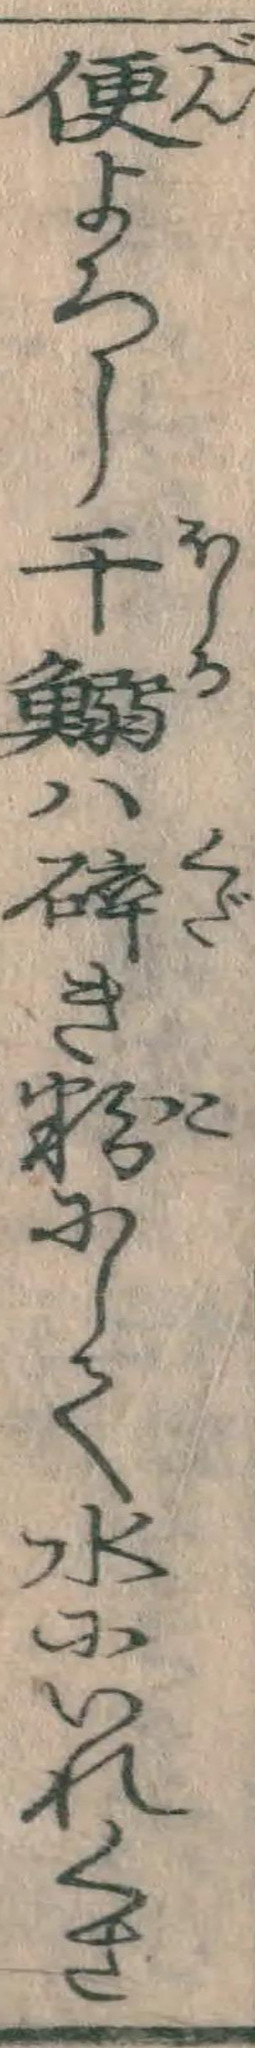便よろし干鰯は砕き粉にして水にいれくさ
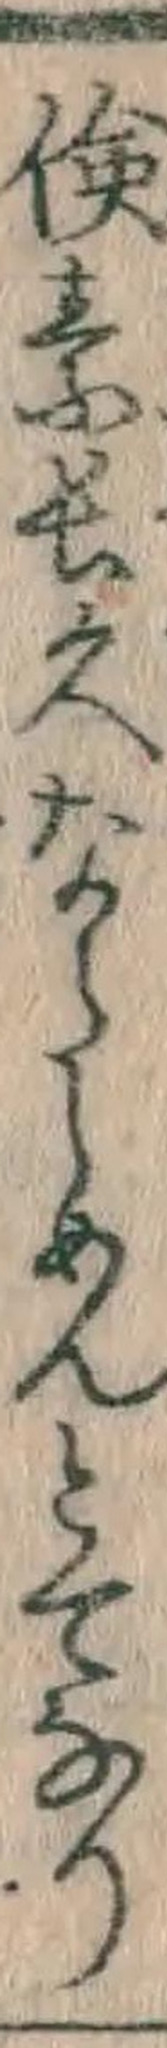倹素長久ならしめんとてなり
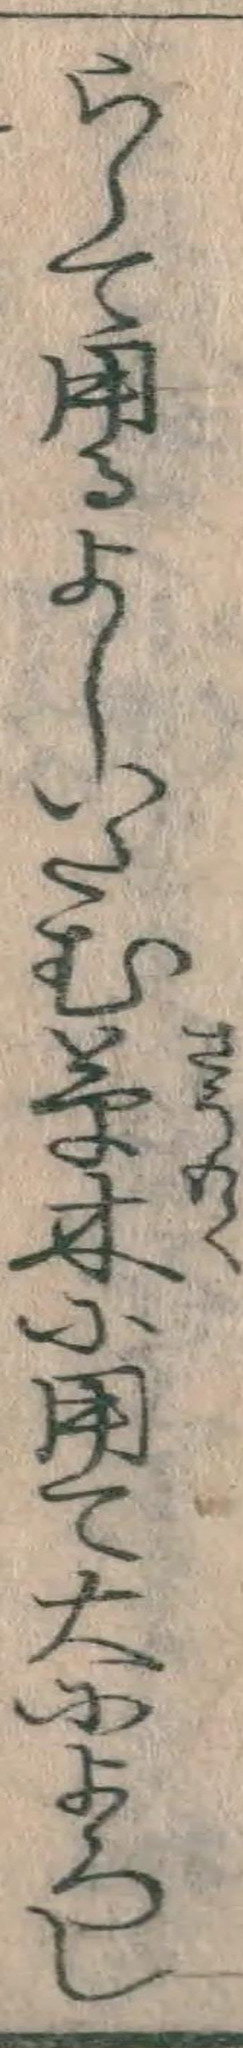らして用るよしいたむ草木に用て大によろし
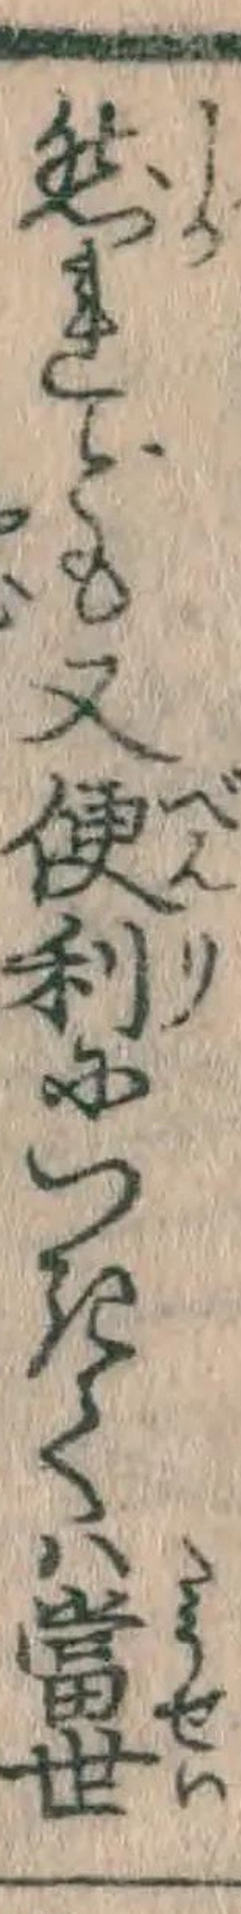然れども又便利につきては当世
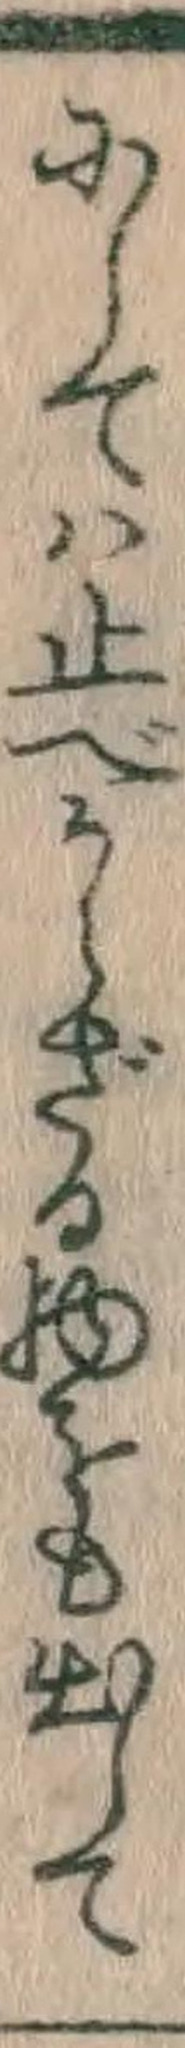にしては止べからざる物をも出して
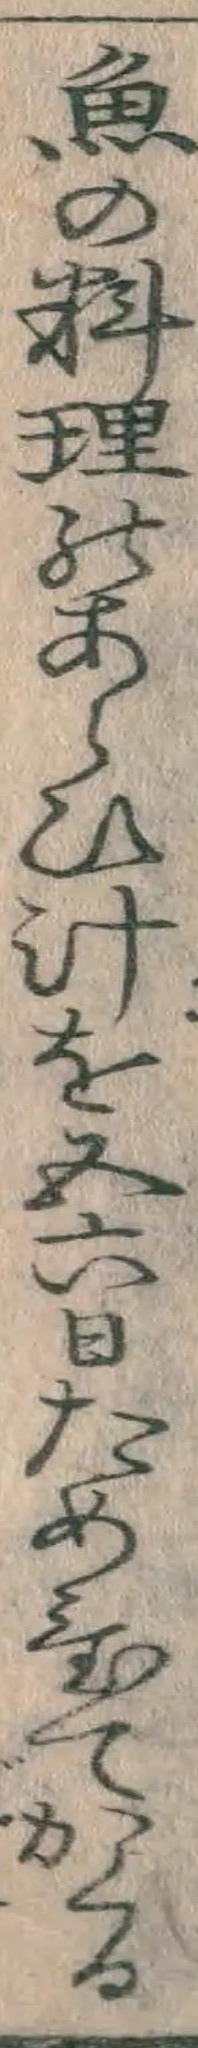魚の料理のあらひ汁を五六日ため置てかくる
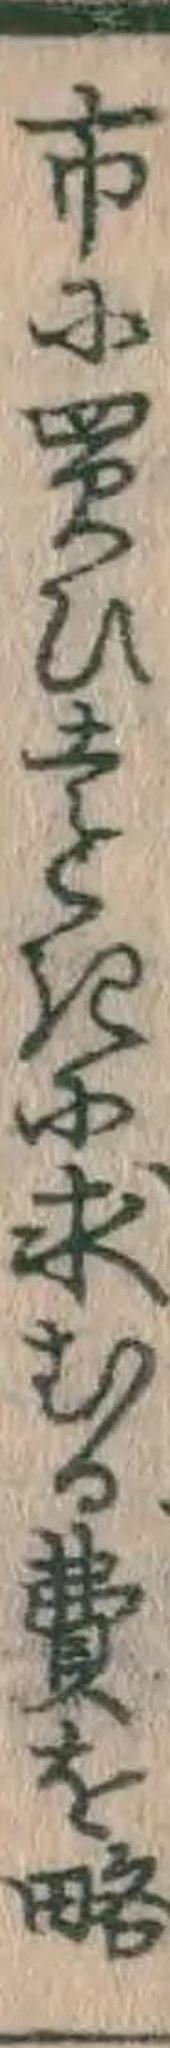市に買ひ遠きに求むる費を略
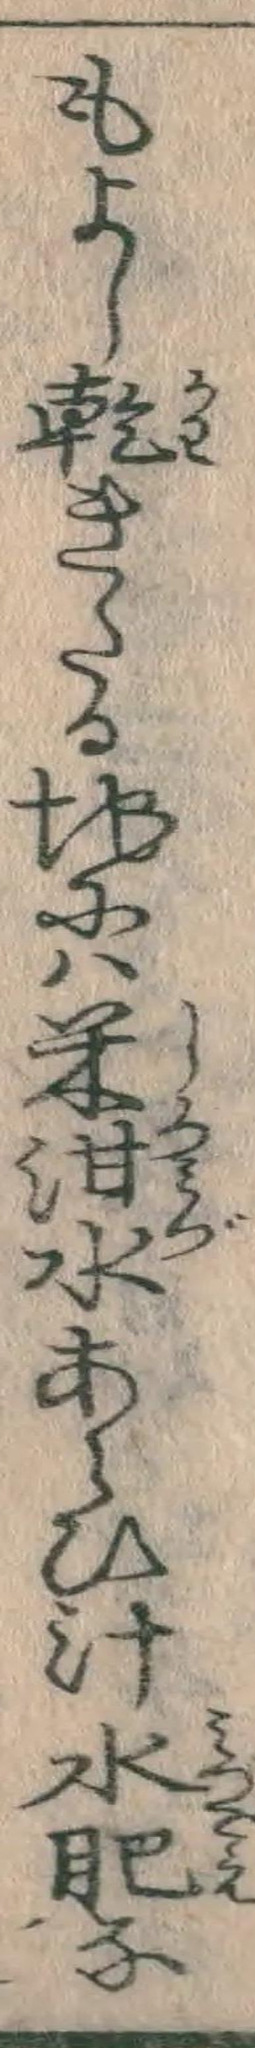もよし乾きたる地には米泔水あらひ汁水肥な
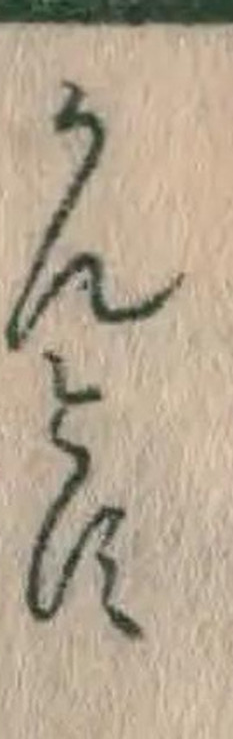かんとす
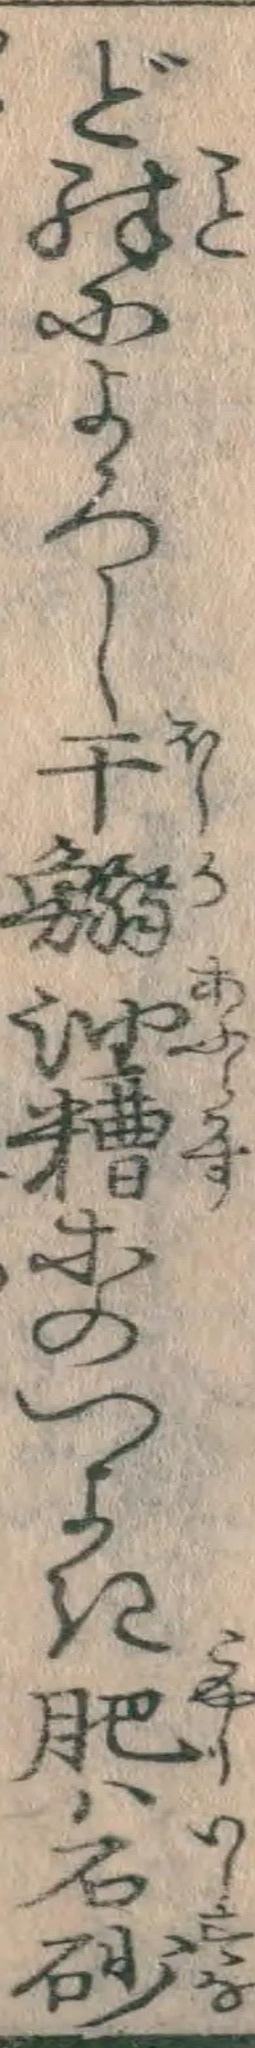ど殊によろし干鰯油糟等のつよき肥は石砂
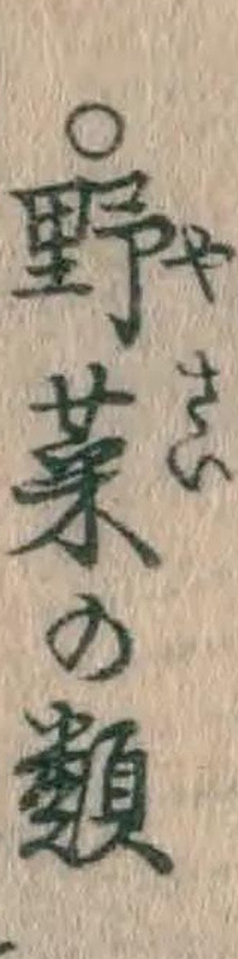◦野菜の類
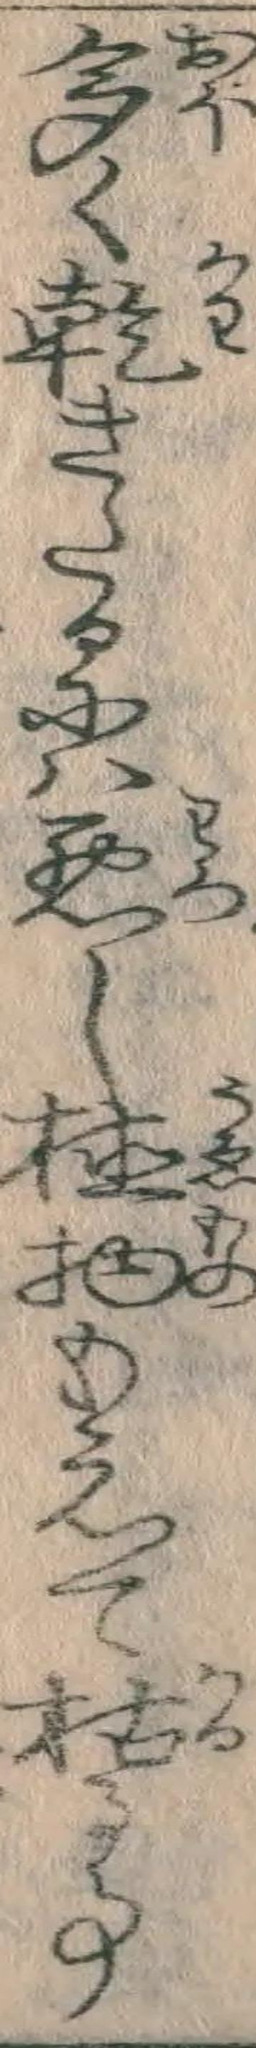多く乾きたるには悪し植物もえて枯る事
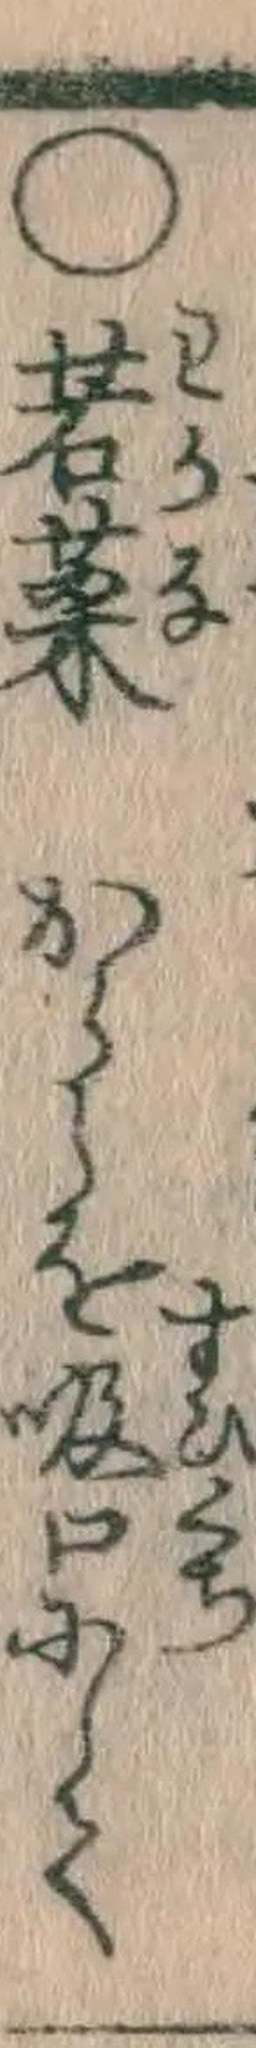○若菜からしを吸口にして
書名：広益秘事大全 3巻. [5]
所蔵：国立国会図書館 National Diet Library, JAPAN
